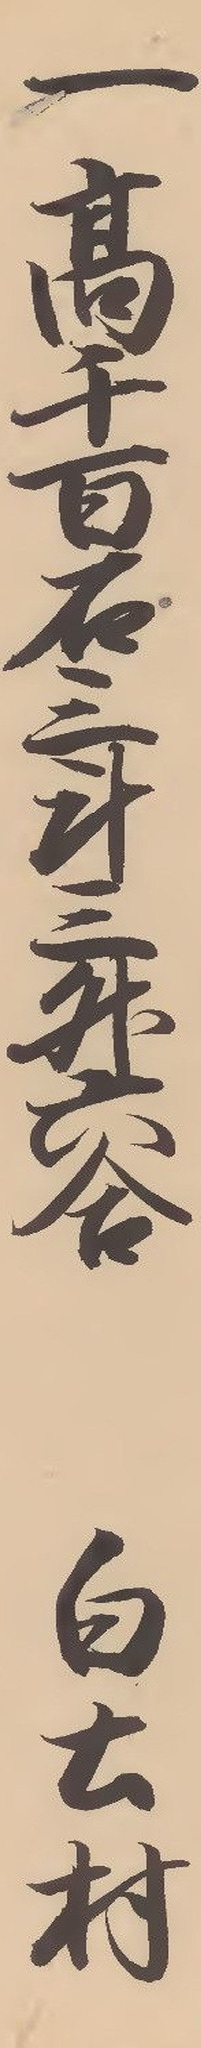一高千百石三斗三升六合白土村
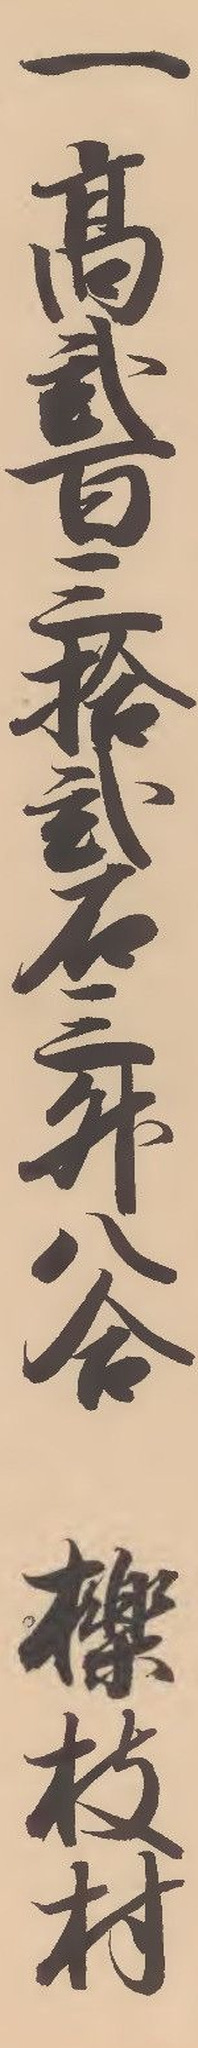一高弐百三拾弐石三升八合櫟枝村

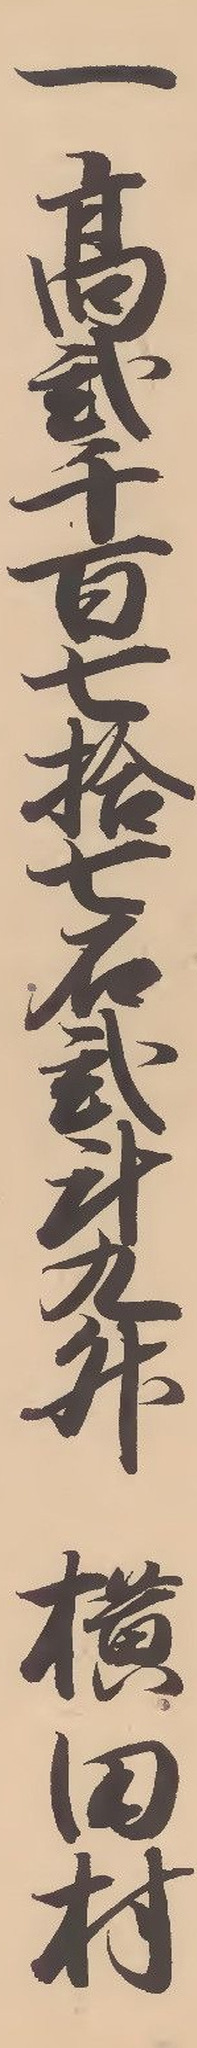一高弐千百七拾七石弐斗九升横田村
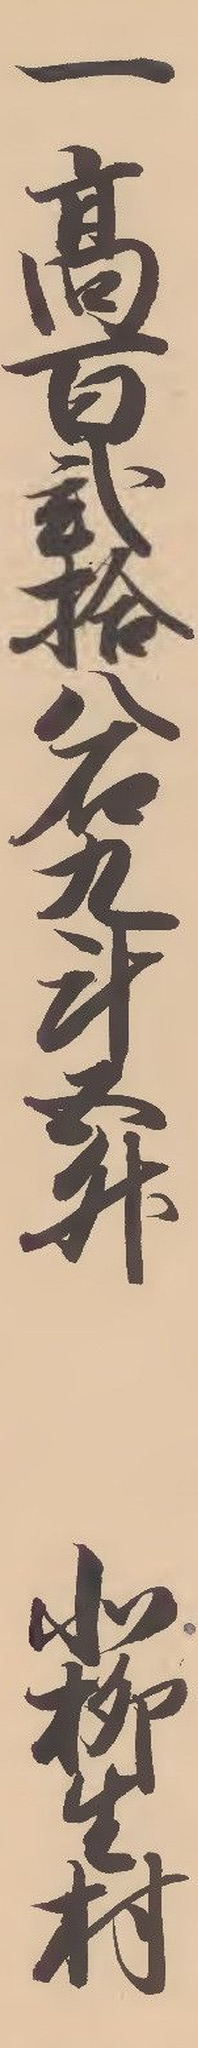一高百弐拾八石九斗五升北柳生村
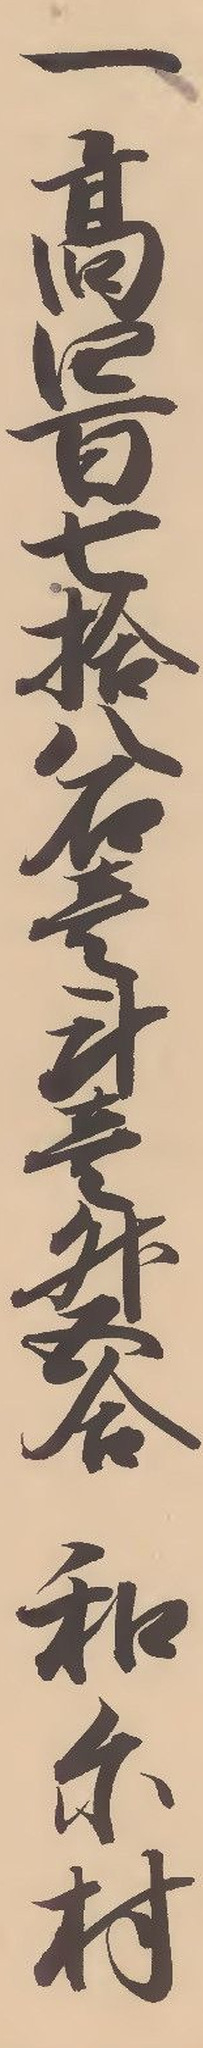一高四百七拾八石壱斗壱升五合和爾村
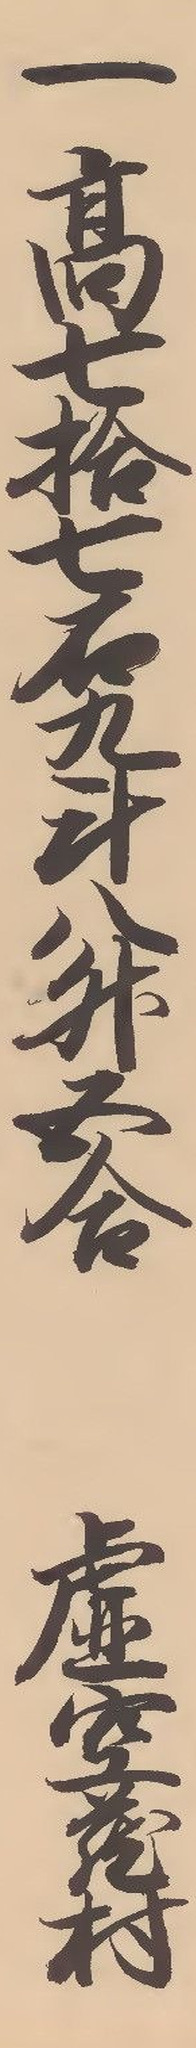一高七拾七石九斗八升五合虚空蔵村
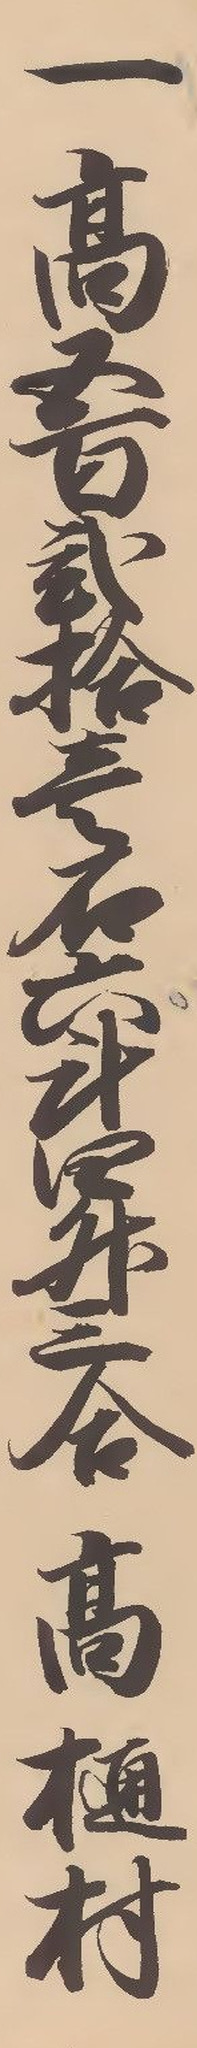一高五百弐拾壱石六斗四升三合高樋村
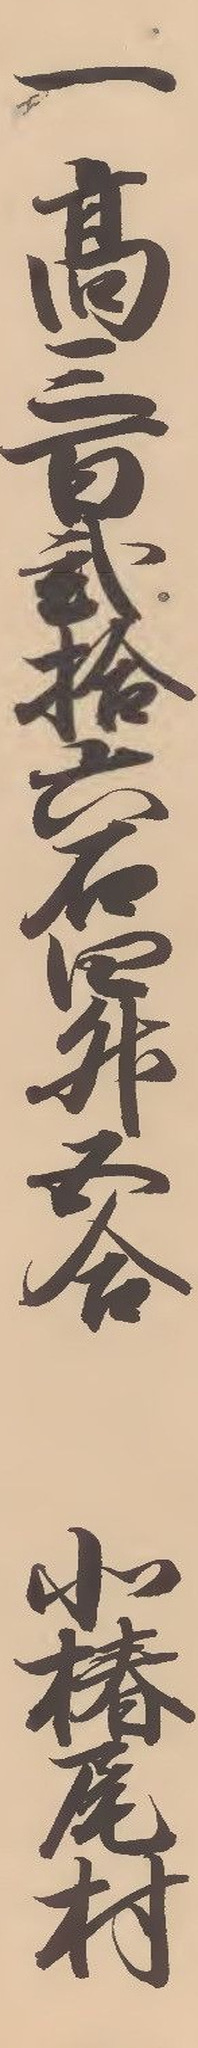一高三百弐拾六石四升五合北椿尾村
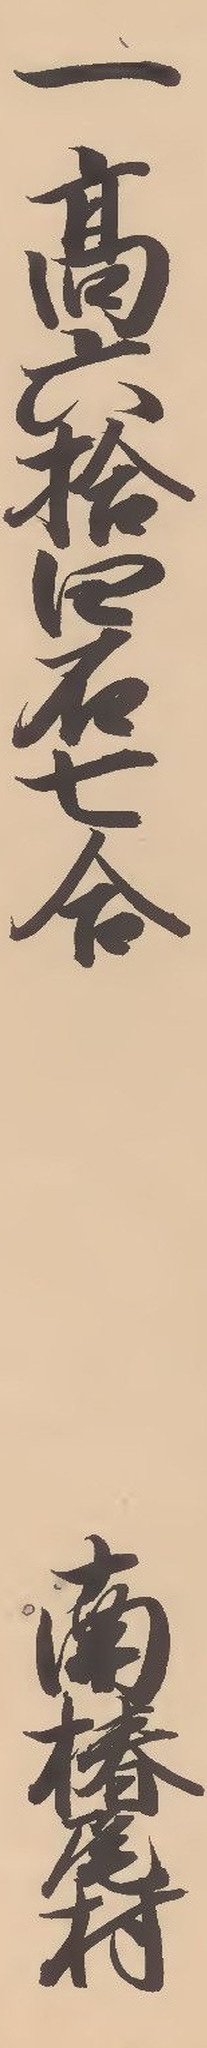一高六拾四石七合南椿尾村
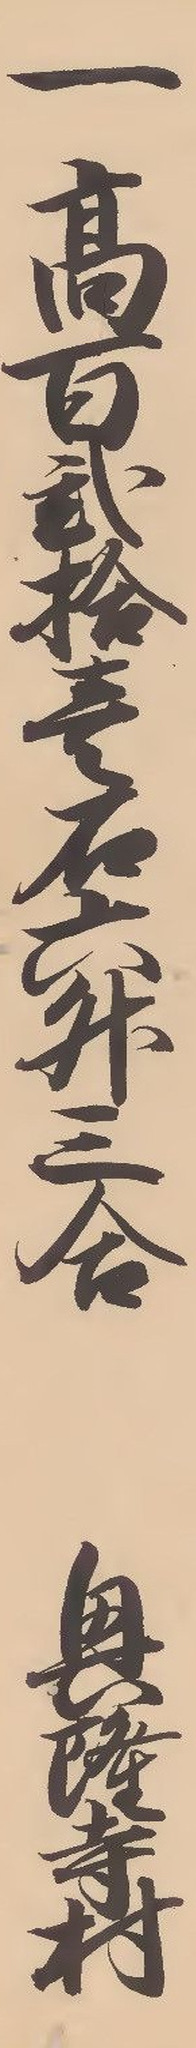一高百弐拾壱石六升三合興隆寺村

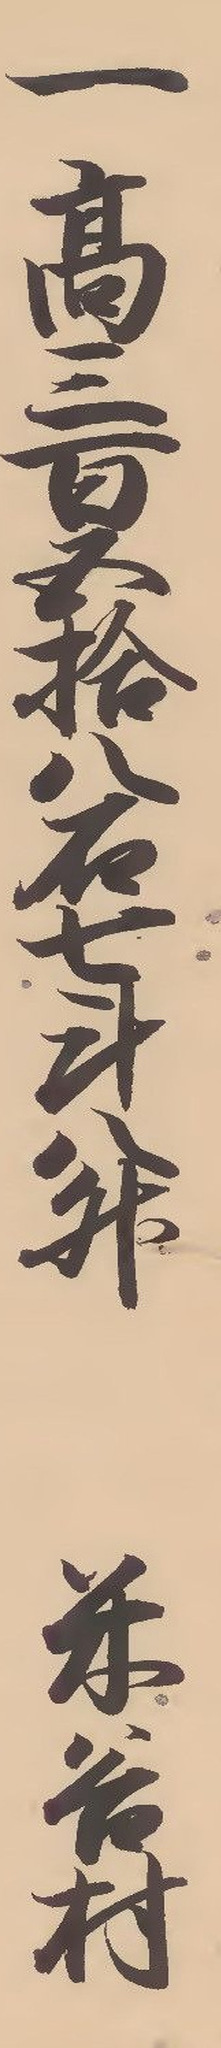一高三百五拾八石七斗八升米谷村
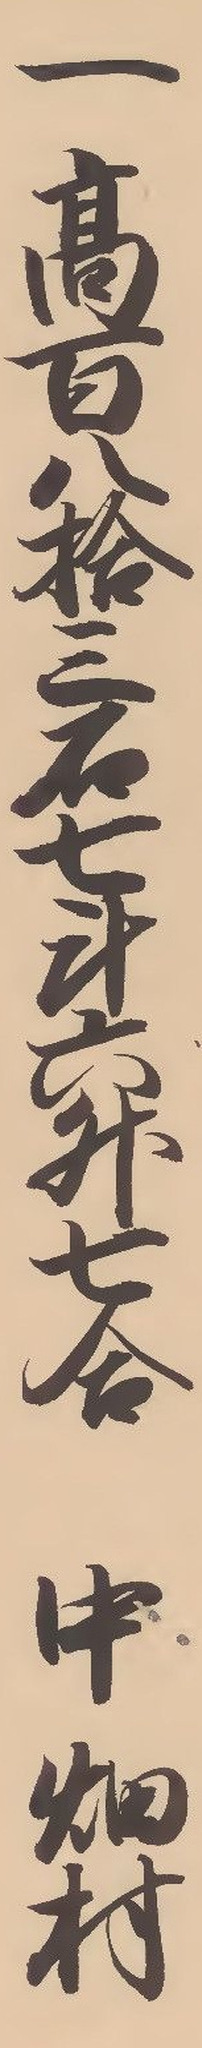一高百八拾三石七斗六升七合中畑村
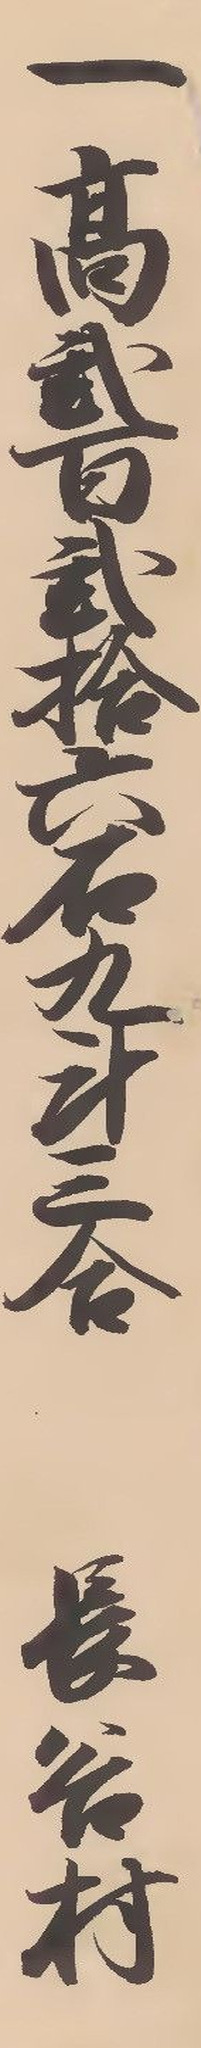一高弐百弐拾六石九斗三合長谷村
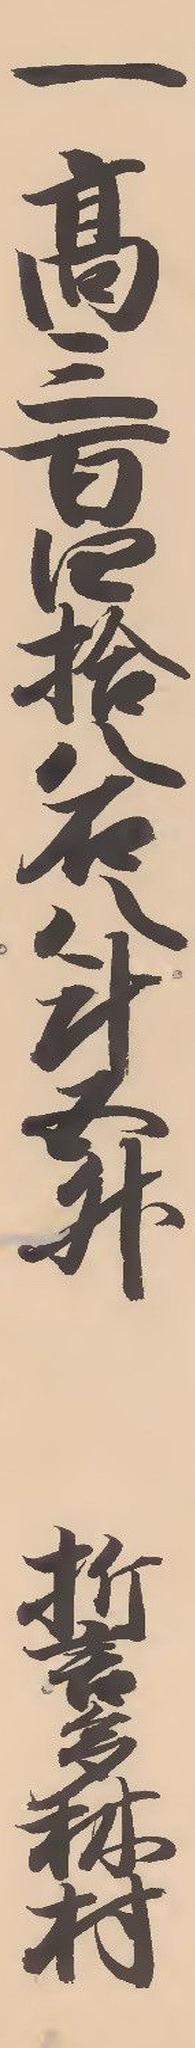一高三百四拾八石八斗五升誓多林村

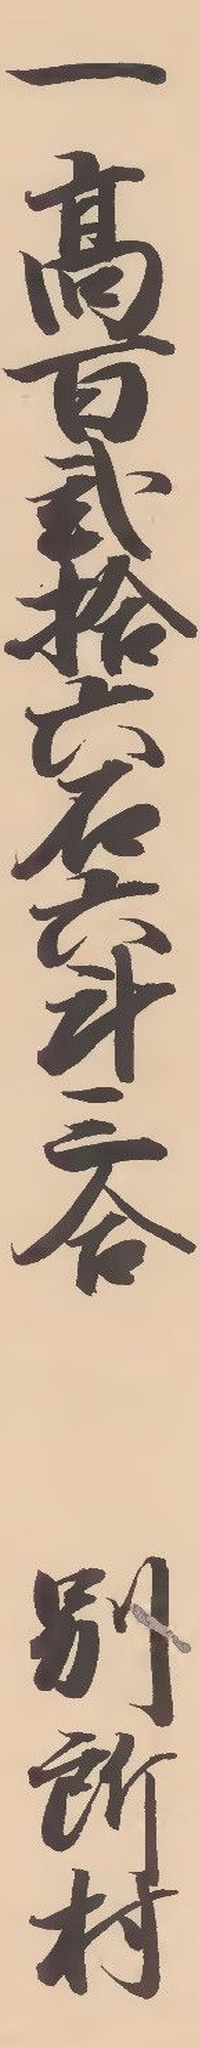一高百弐拾六石六斗三合別所村
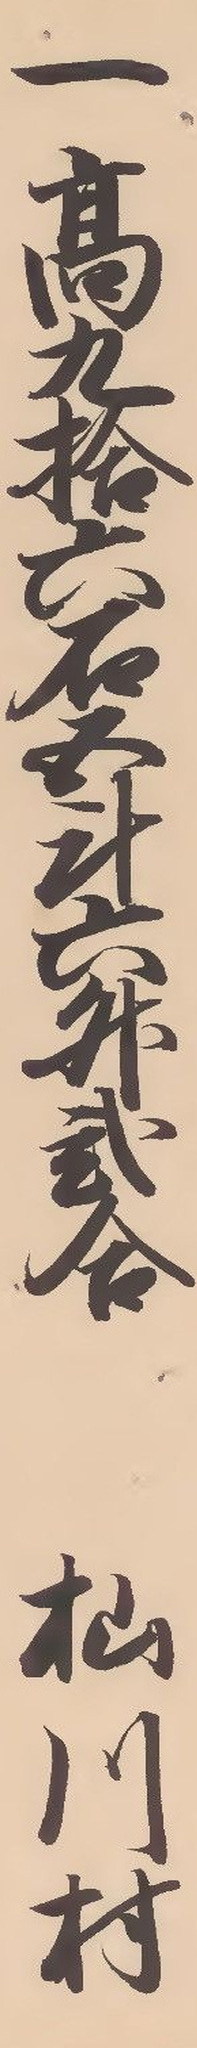一高九拾六石五斗六升弐合杣川村
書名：大和国郷帳
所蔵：国立公文書館 National Archives of Japan
